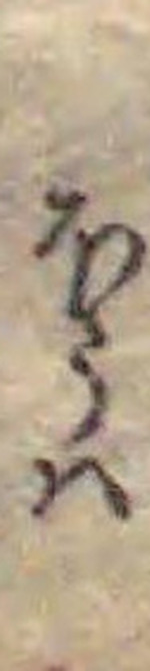ほうは
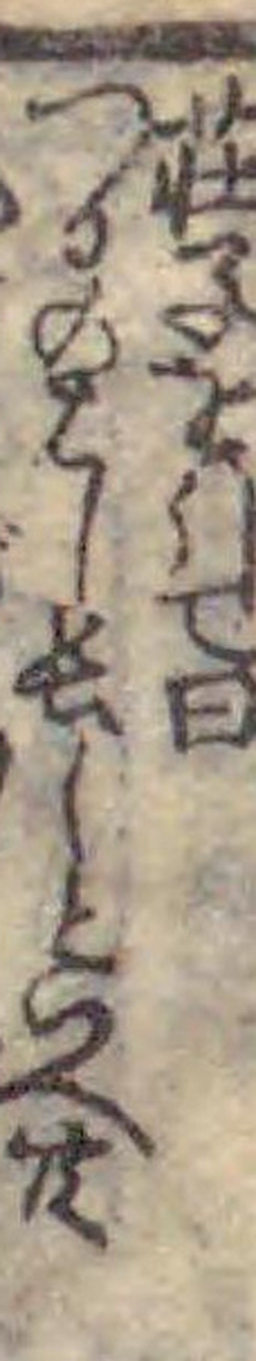つるのはし長しといへ共
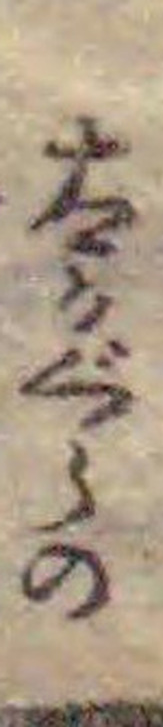太かぐらの
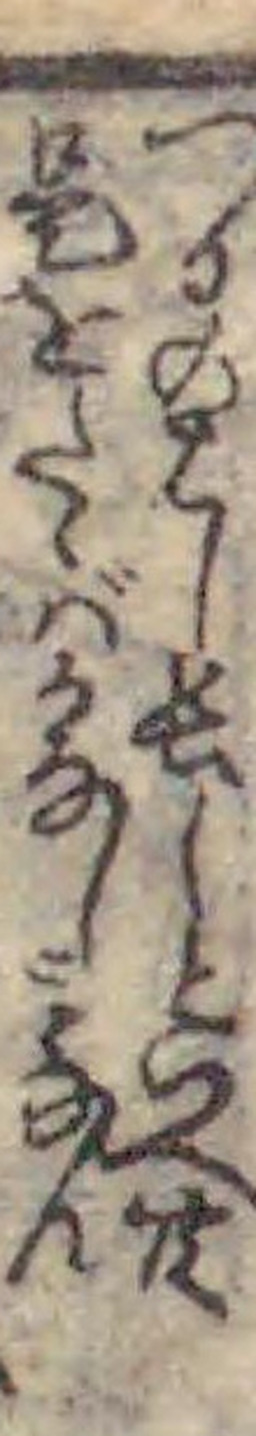是をたゝばかなしみなん
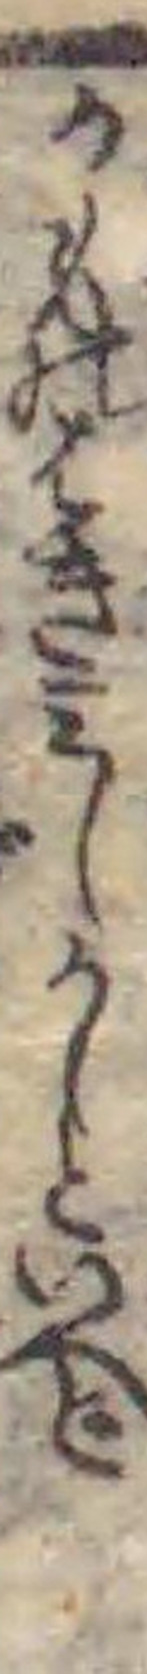かものはきみしかしといへど
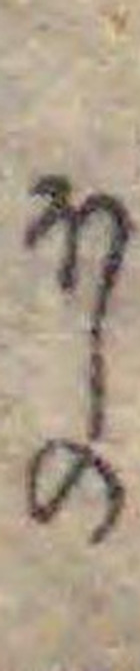ほしの
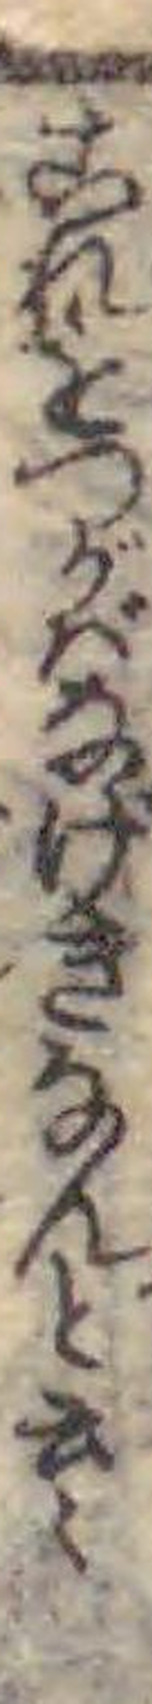これをつがばなげきなんと云々
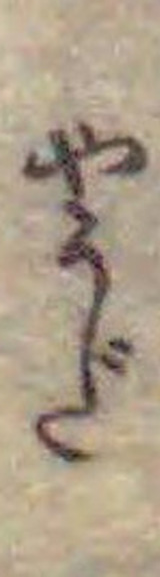やうだ
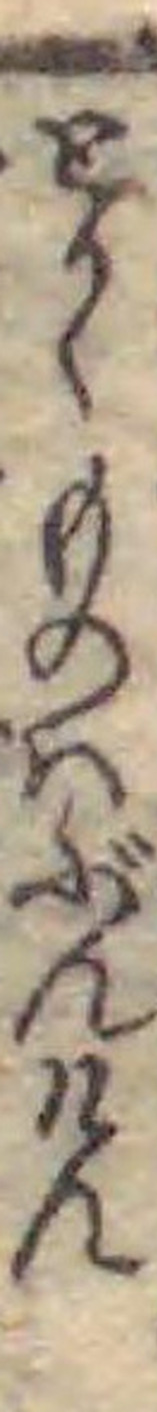とかくものはぶんけん
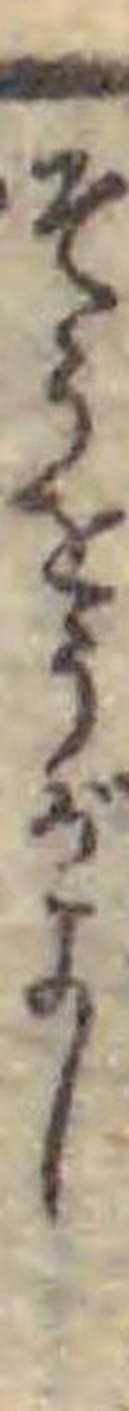そうをうがよし
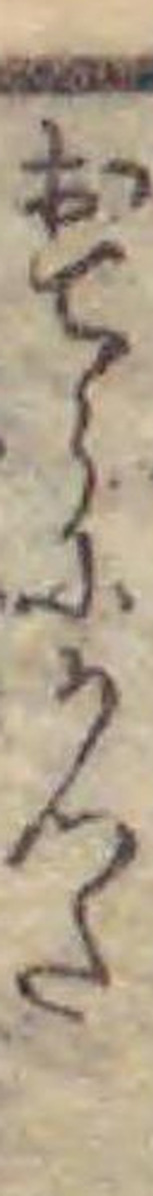おてらにかつた
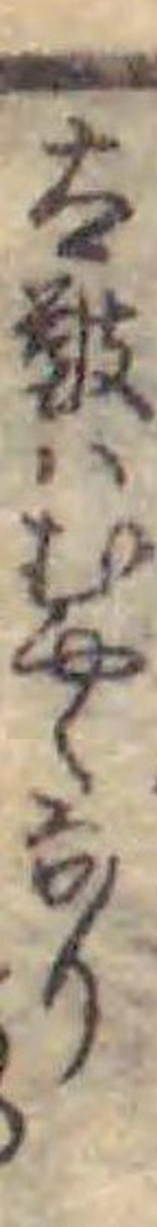太鼓はむやくなり
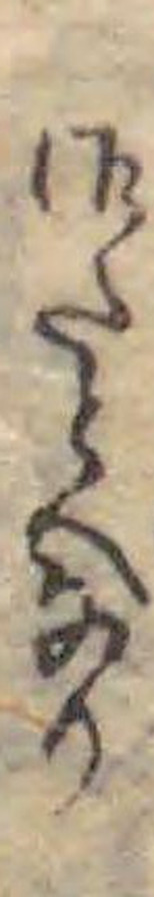御たとへなり

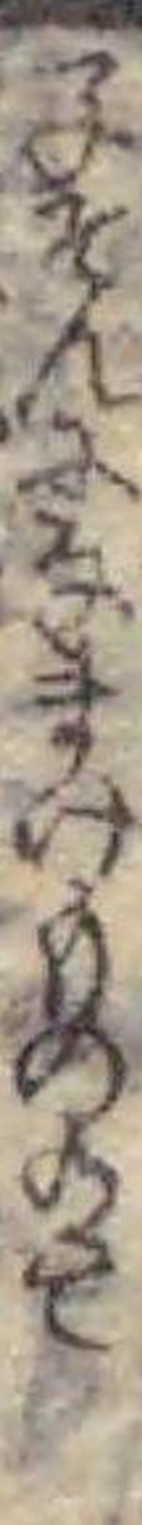子そんになまけもの有て
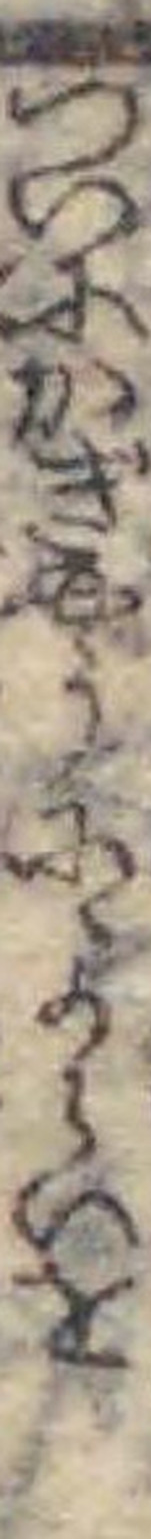ついにかぎやうによらいを
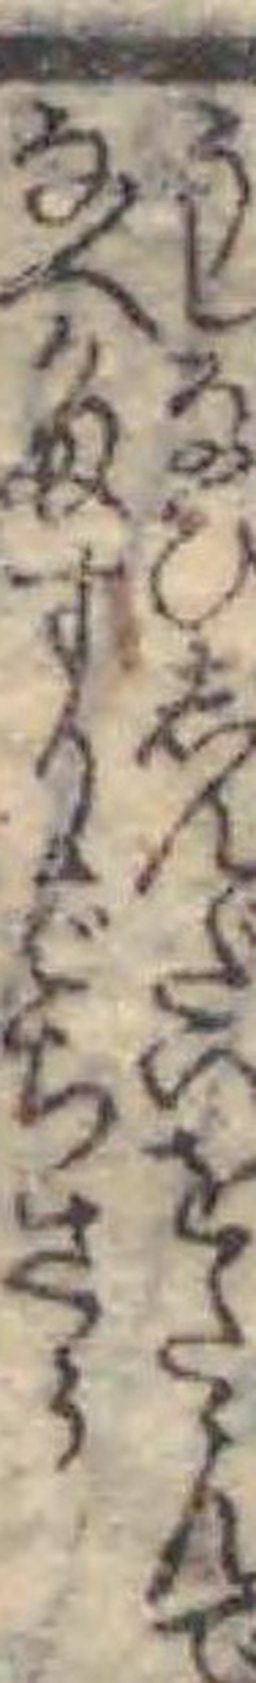なへかますりばちさら
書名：身体開帳略縁起 : 3巻
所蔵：国立国会図書館 National Diet Library, JAPAN
